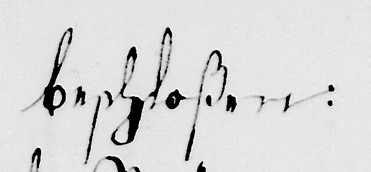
beschloßen:
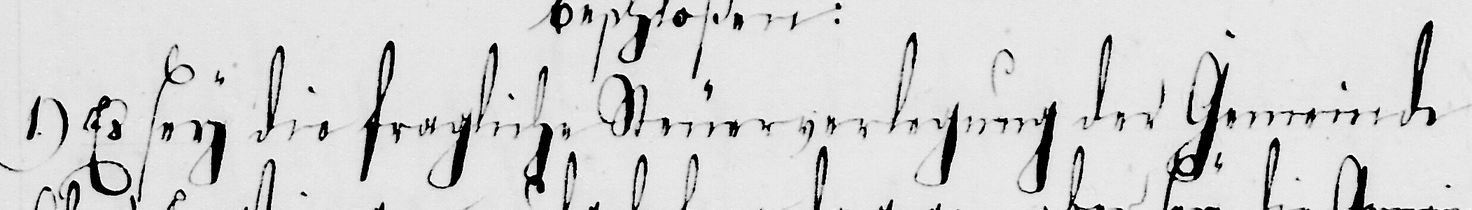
1.) Es sey die fragliche Steuerverlegung der Gemeinde
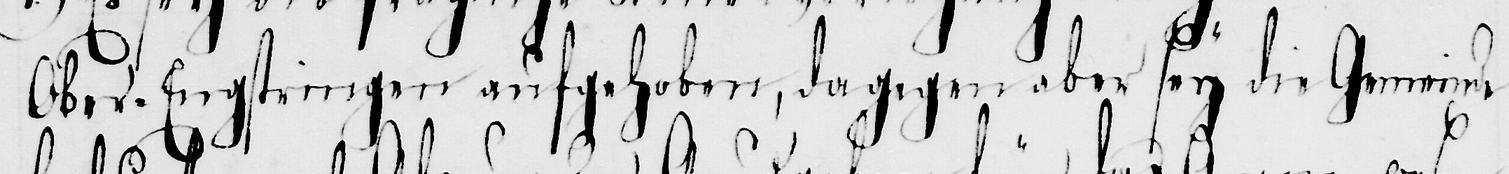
Ober-Engstringen aufgehoben, dagegen aber sey die Gemeinde
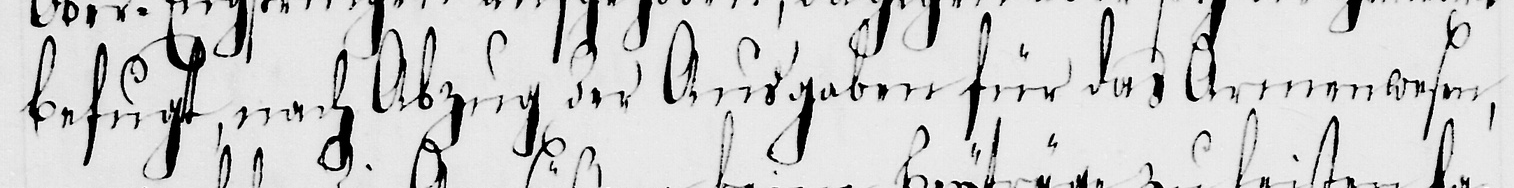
befugt, nach Abzug der Ausgaben für das Armenwesen,
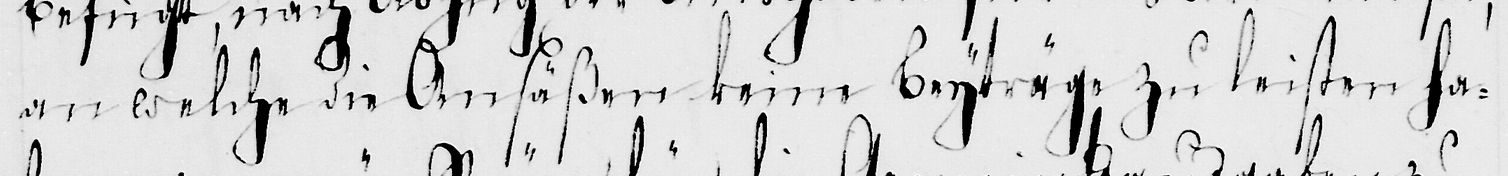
an welche die Ansäßen keine Beyträge zu leisten ha¬
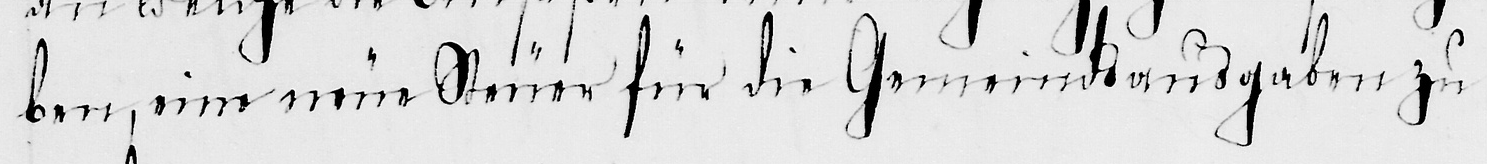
ben, eine neue Steuer für die Gemeindsausgaben zu
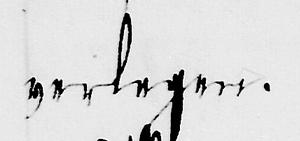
verlesen
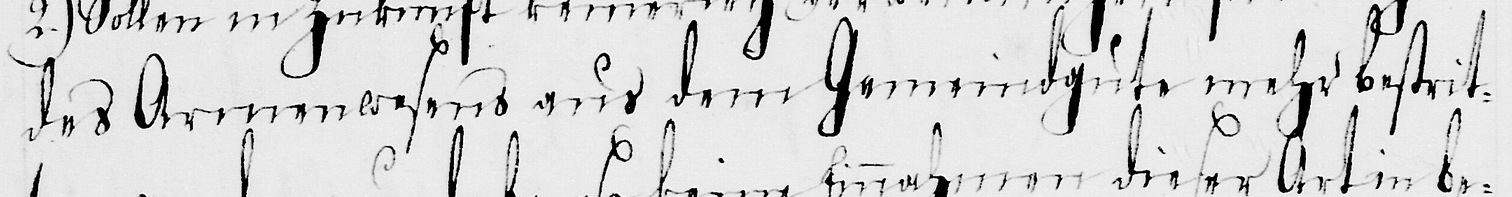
des Armenwesens aus dem Gemeindgute mehr bestrit¬
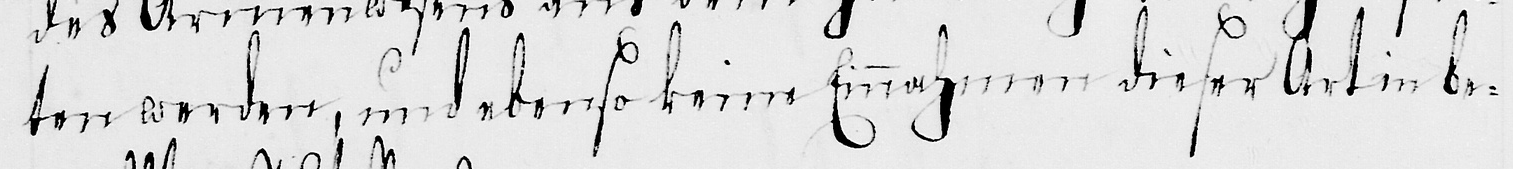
ten werden, und ebenso keine Einnahmen dieser Art in be¬
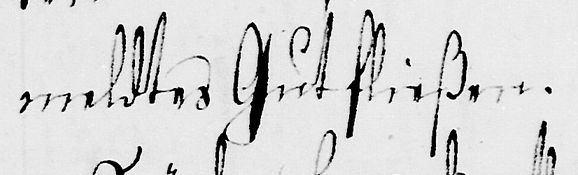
meldtes Gut fließen.
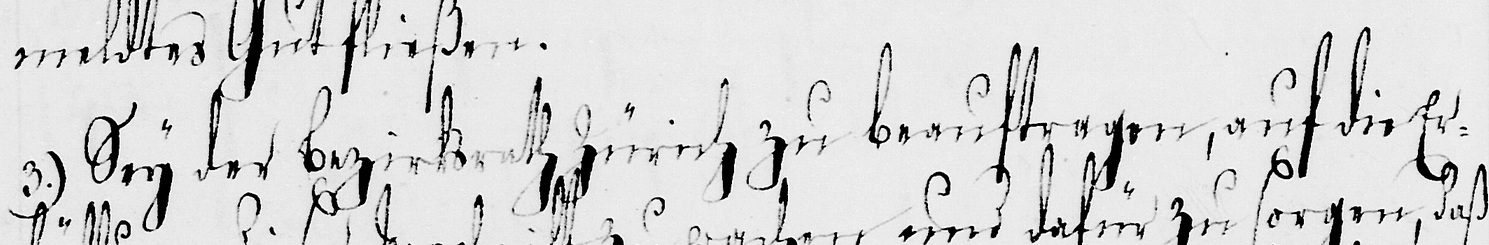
Sey der Bezirksrath Zürich zu beauftragen, auf die Er¬
